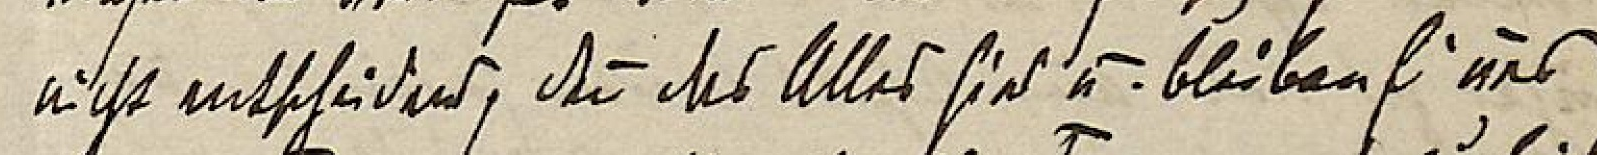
nicht entscheidend, den das Alles sind u. bleiebn fü uns
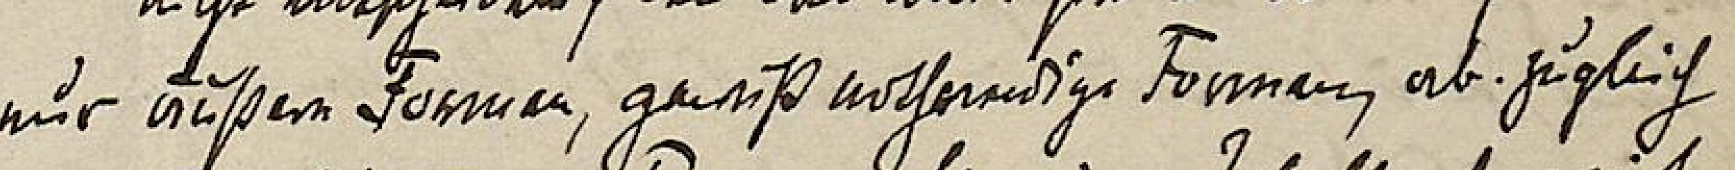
nur äußere Formen, gewiß nothwendige Formen, ab. zugleich
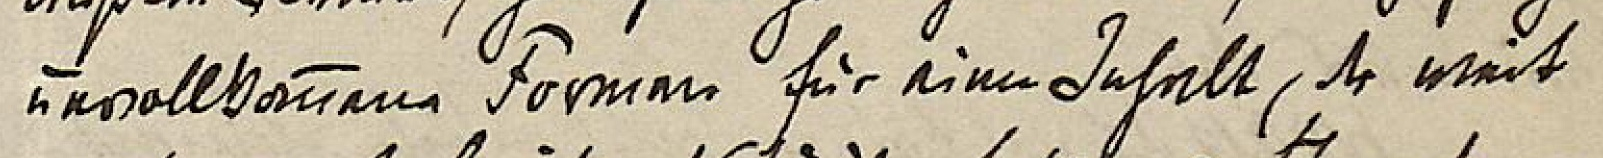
unvolkomene Formen für einen Inhalt, der weit
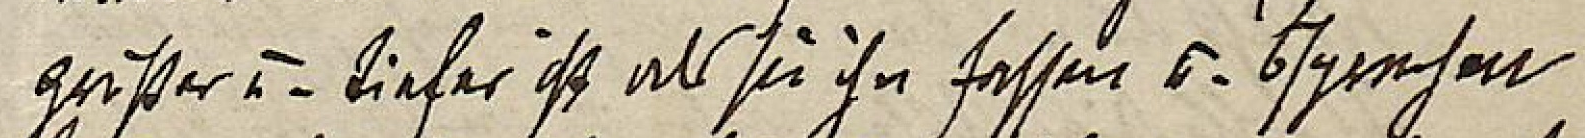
größer u. tiefer ist als sie ihn fassen u. ssprechen
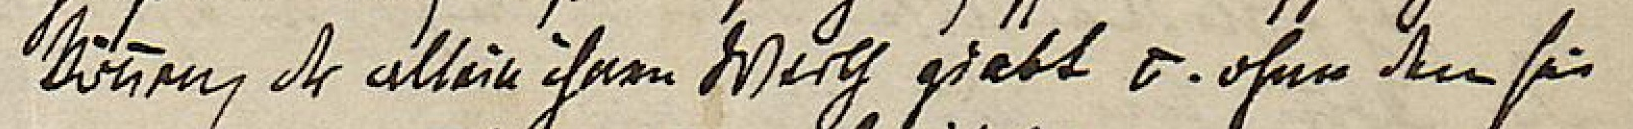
könen, der allein ihnen Werth giebt u. ohne den sie
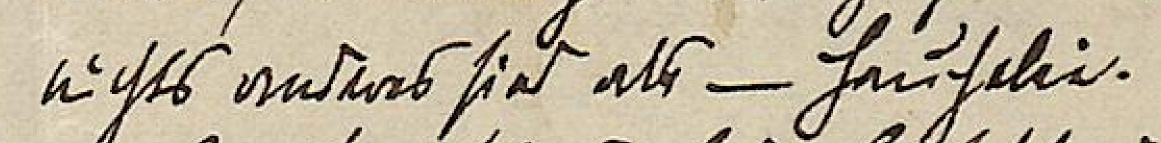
nichts anderes sind als _ Heuchelei.
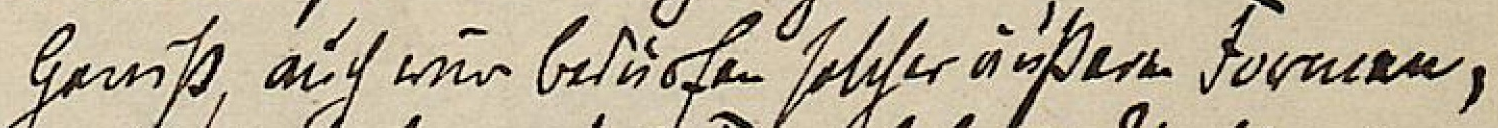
Gewiß, auch wir bedürfen solcher äußeren Formen,
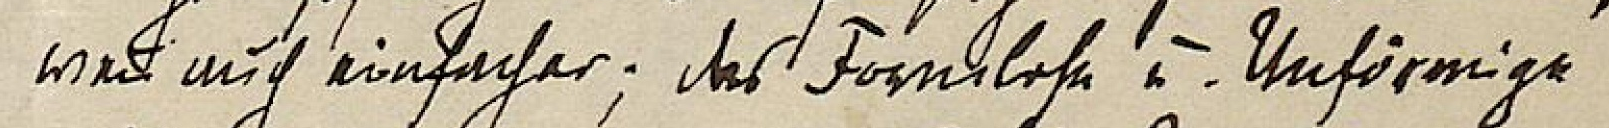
wen auch einfache; das Formlose u. Unförmige
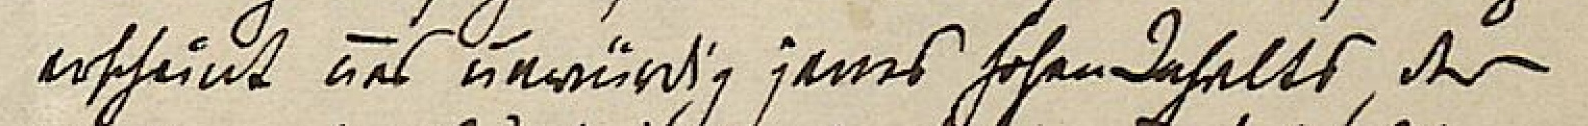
erscheint uns unwürdig jenes hohen Inhalts, der
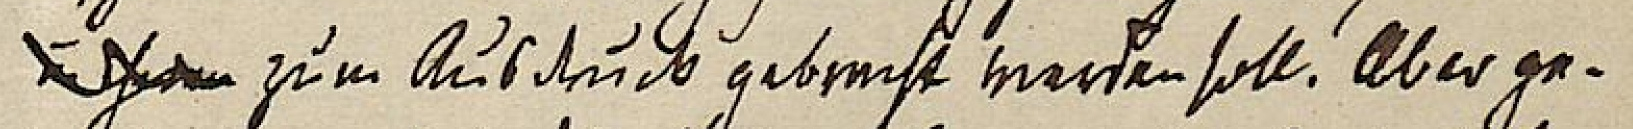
in ihnen zum Ausdruck gebracht werden soll. Aber ge¬
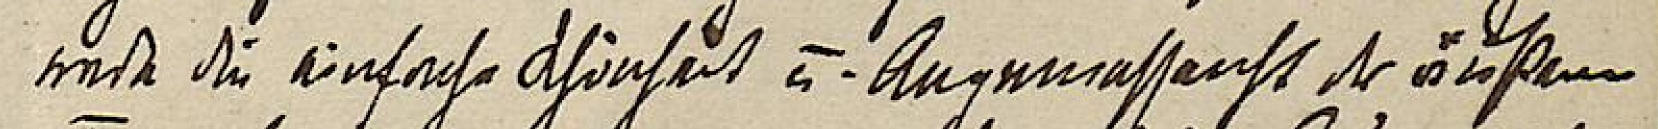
rade die einfache Schönheit u. Angemessenht. der äußeren
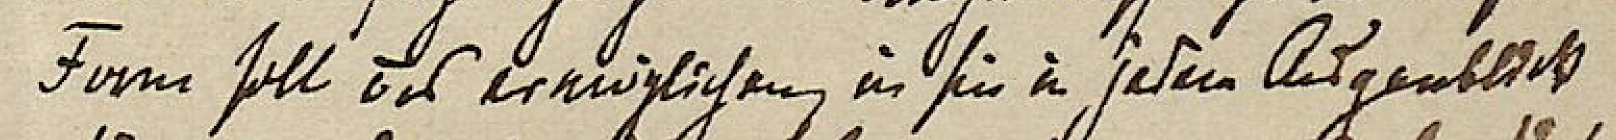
Form soll uns ermöglichen, in sie in jedem Augenblick
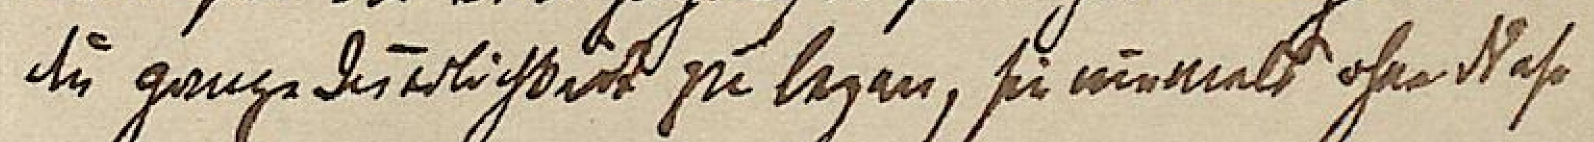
die ganze Inerlichkeit zu legen, sie niemals ohne diese
